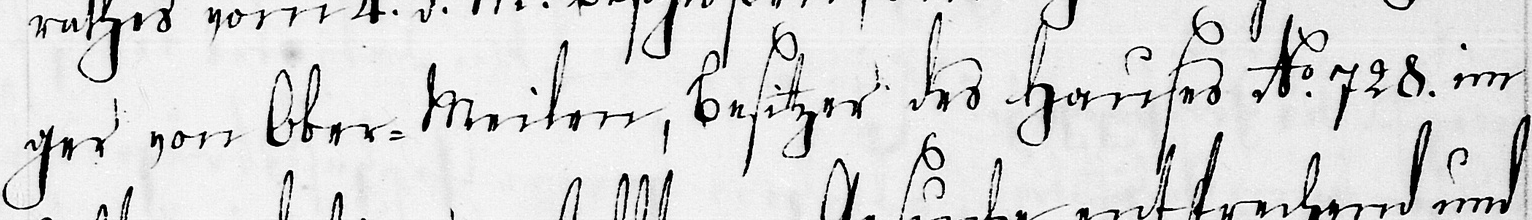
ger von Ober-Meilen, Besitzer des Hauses No. 728. im
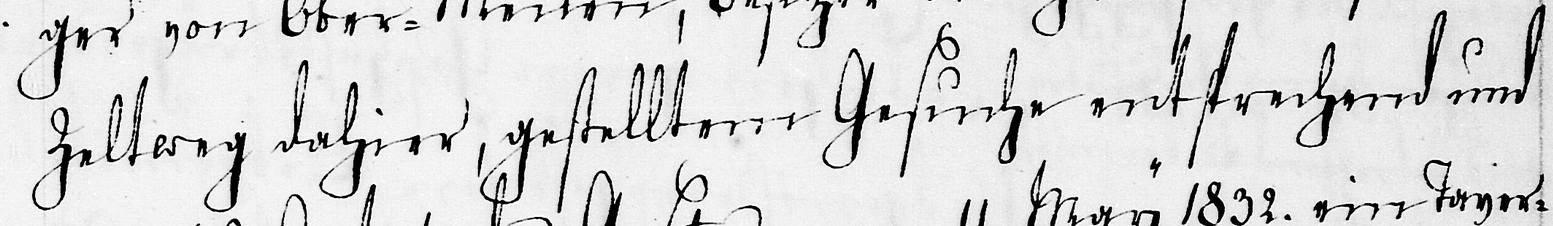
Zeltweg dahier, gestelltem Gesuche entsprechend und
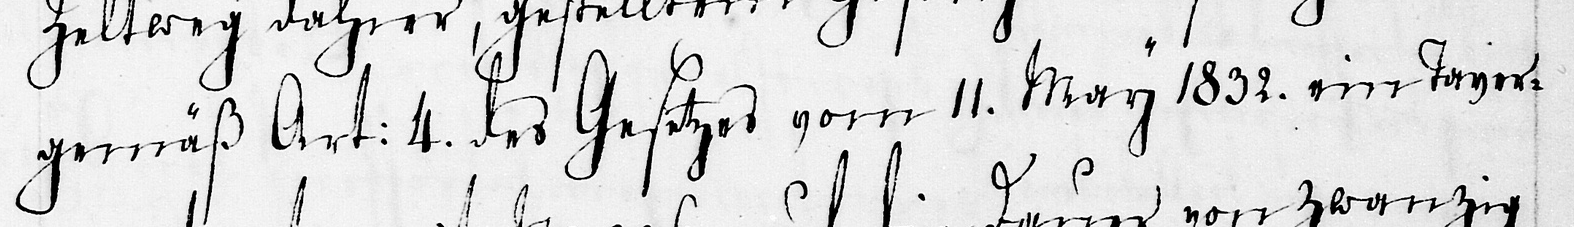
gemäß Art: 4. des Gesetzes vom 11. März 1832. ein Taver¬
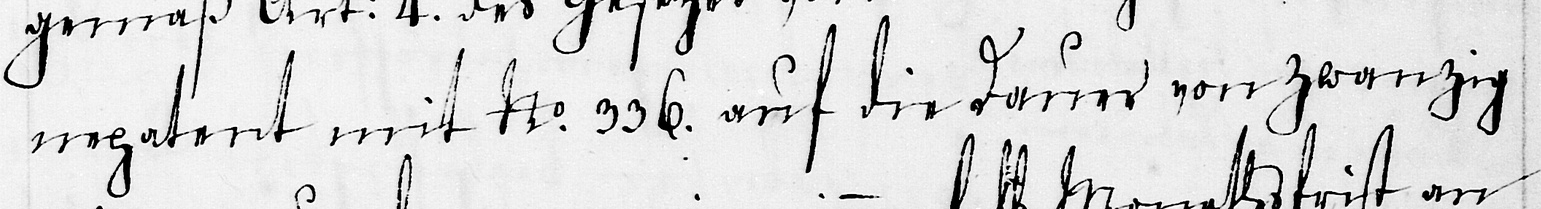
nepatent mit No. 336. auf die Dauer von zwanzig
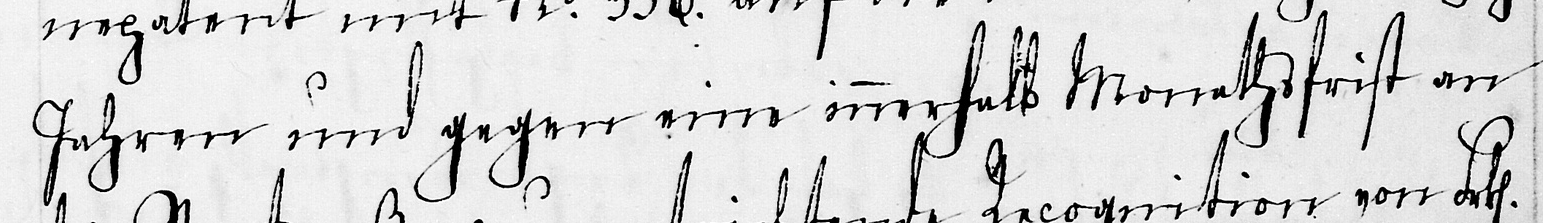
Jahren und gegen eine innerhalb Monathsfrist an
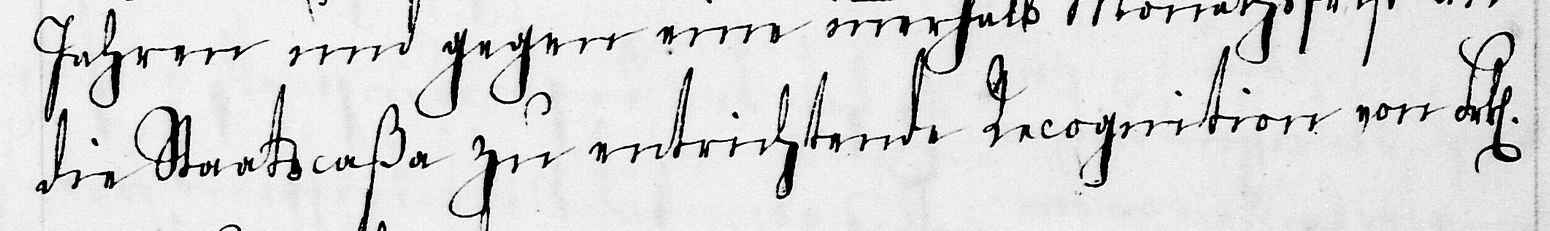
die Staatscaßa zu entrichtende Recognition von Frk[e¬
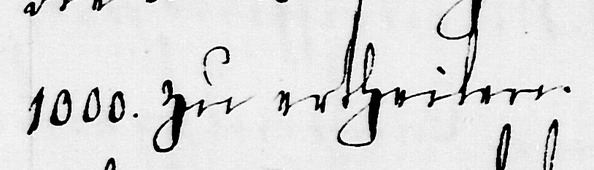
1000. zu ertheilen.
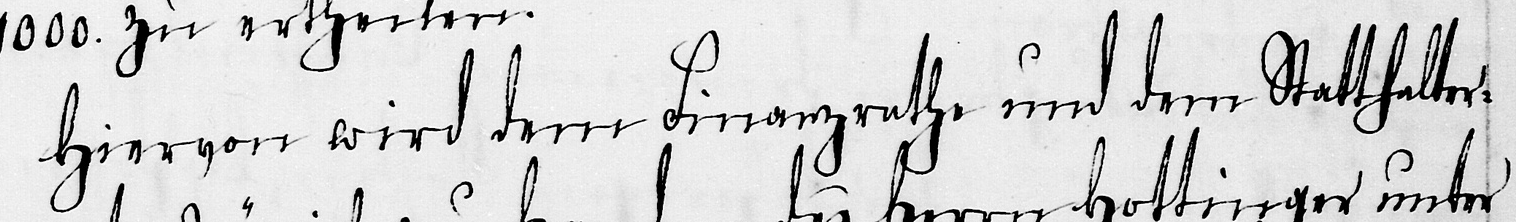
Hiervon wird dem Finanzrathe und dem Statthalte¬
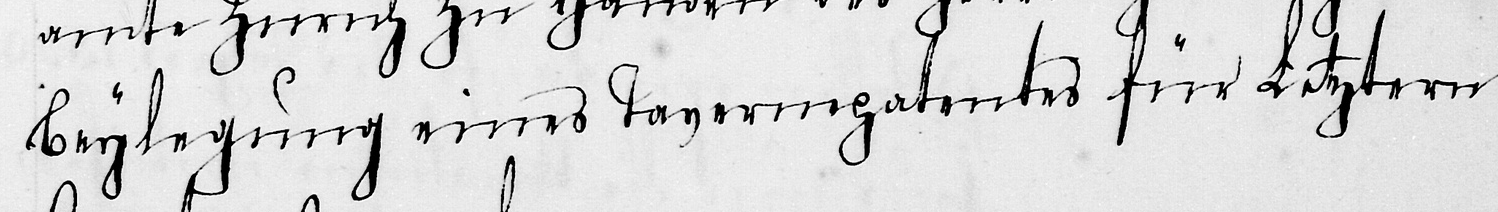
Beylegung eines Tavernepatentes für Letzteren
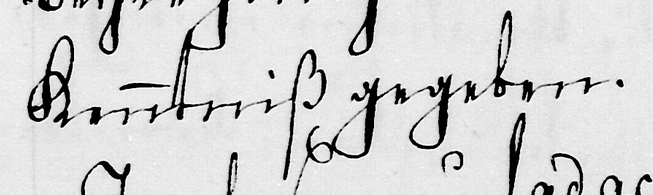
Kenntniß gegeben.
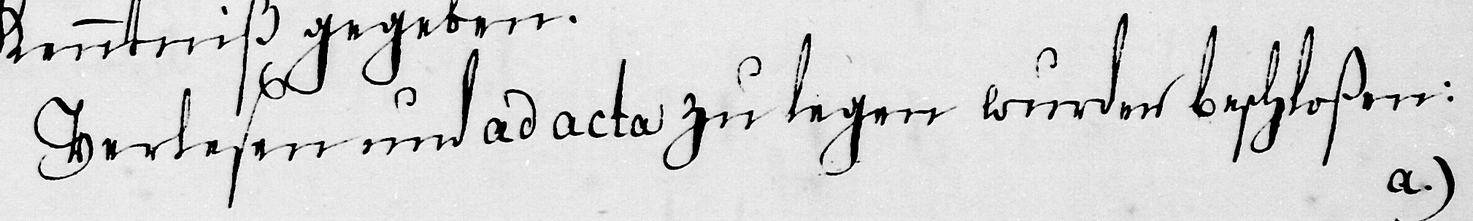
Verlesen und ad acta zu legen wurden beschloßen:
